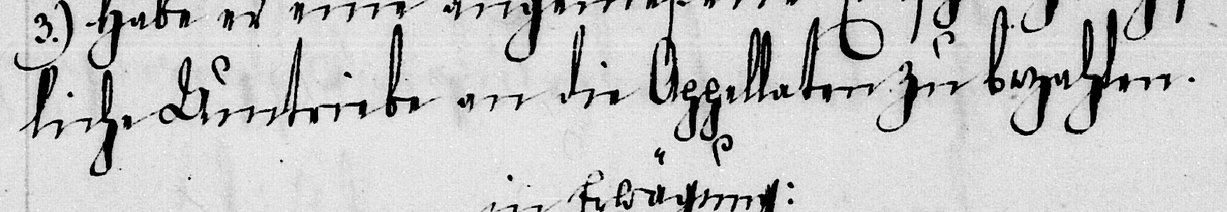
liche Umtriebe an die Appellaten zu bezahlen.
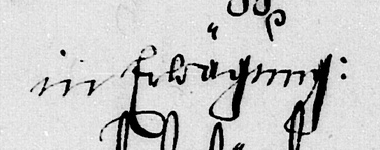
in Erwägung:
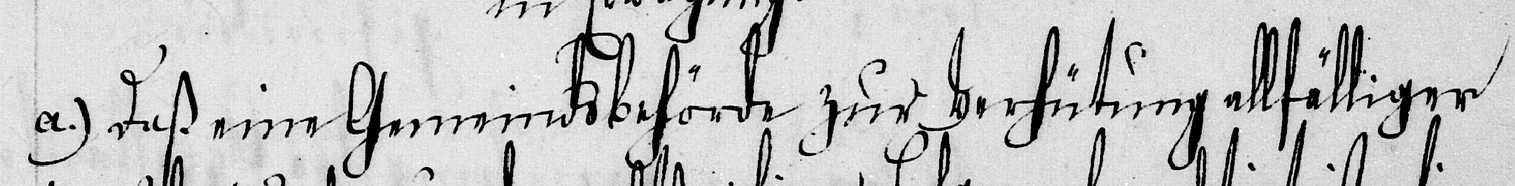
a.) Daß eine Gemeindsbehörde zur Verhütung allfälliger
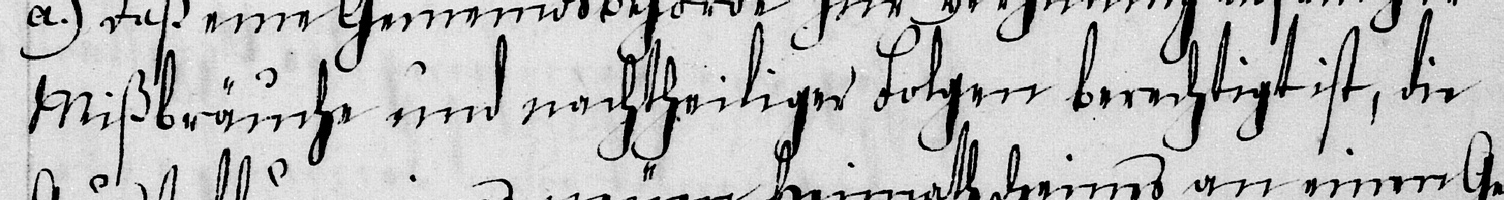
Mißbräuche und nachtheiliger Folgen berechtigt ist, die
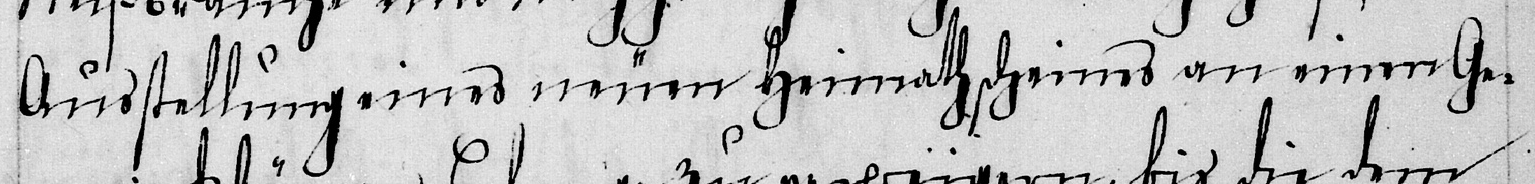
Ausstellung eines neuen Heimathscheines an einen Ge¬
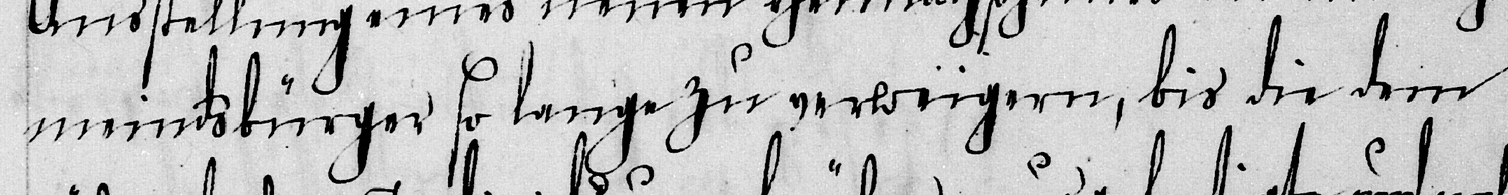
meindsbürger so lange zu verweigern, bis die dem
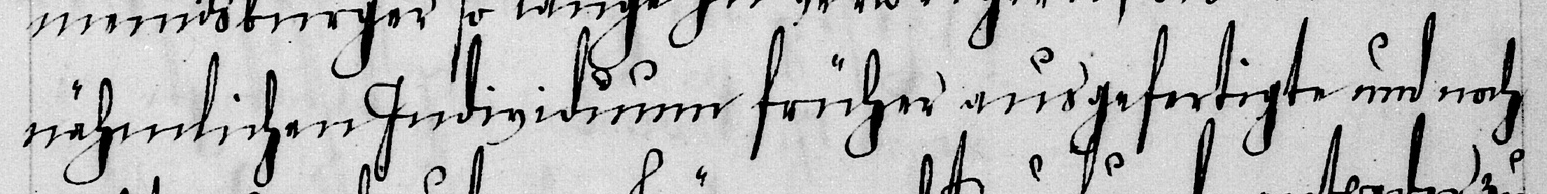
nähmlichen Individuum früher ausgefertigte und noch
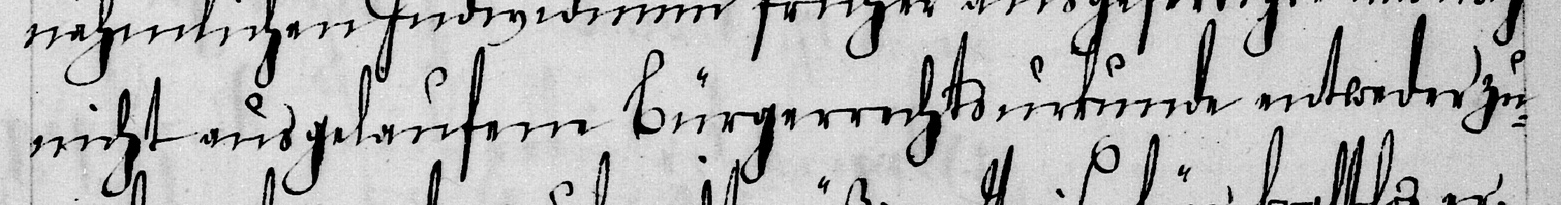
nicht ausgelaufene Bürgerrechtsurkunde entweder zu¬
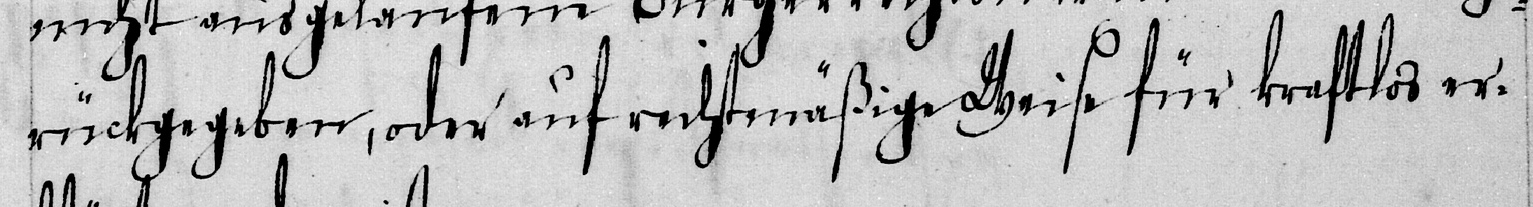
rückgegeben, oder auf rechtmäßige Weise für kraftlos er¬
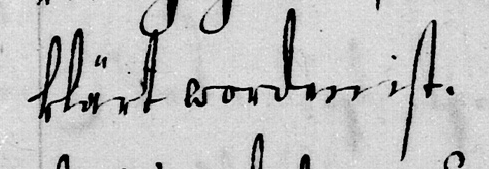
klärt worden ist.
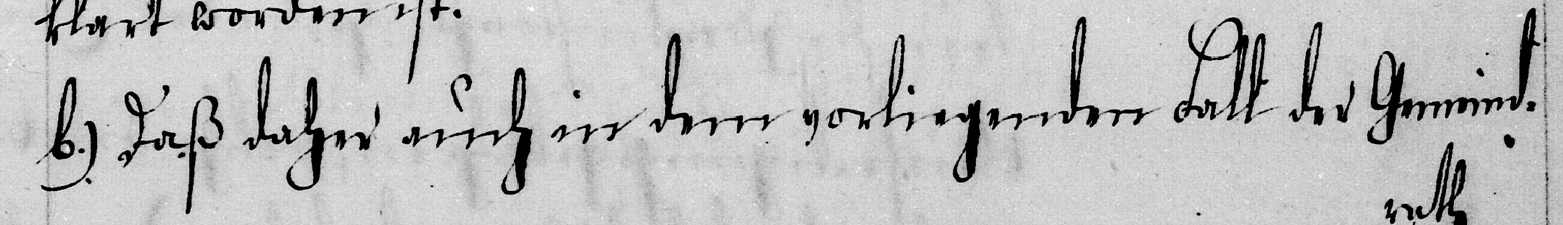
b.) Daß daher auch in dem vorliegenden Fall der Gemein¬
